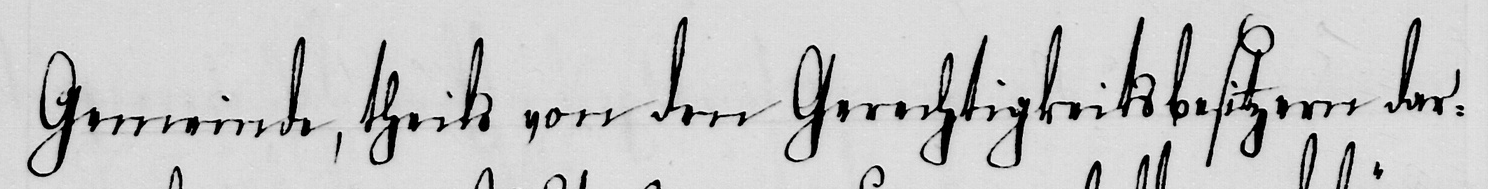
Gemeinde, theils von den Gerechtigkeitsbesitzern dar¬
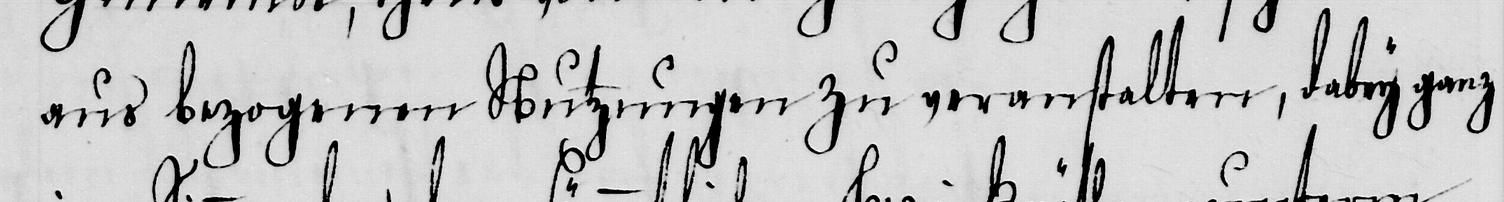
aus bezogenen Nutzungen zu veranstalten, dabey ganz
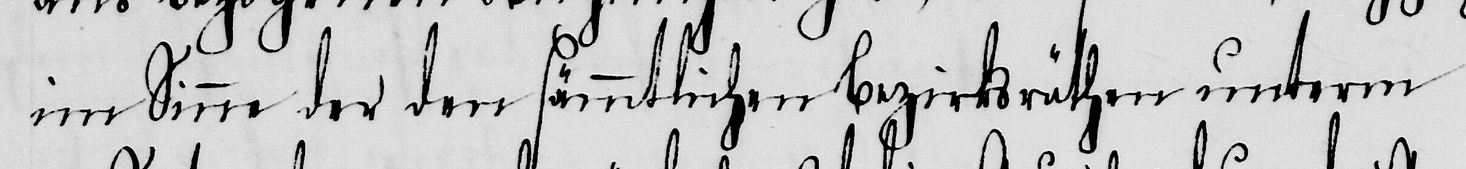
im Sinne der den sämmtlichen Bezirksräthen unterm
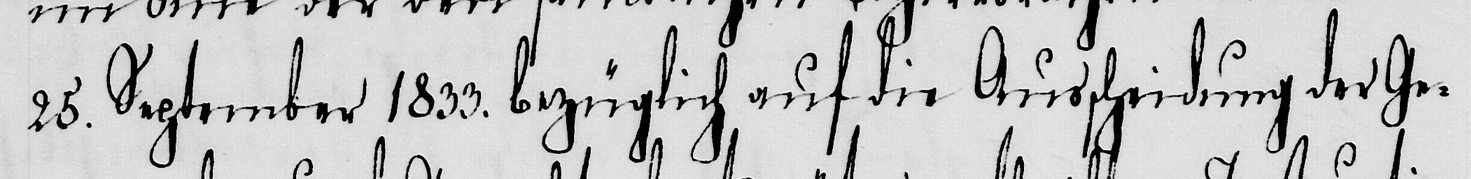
25. September 1833. bezüglich auf die Ausscheidung der Ge¬
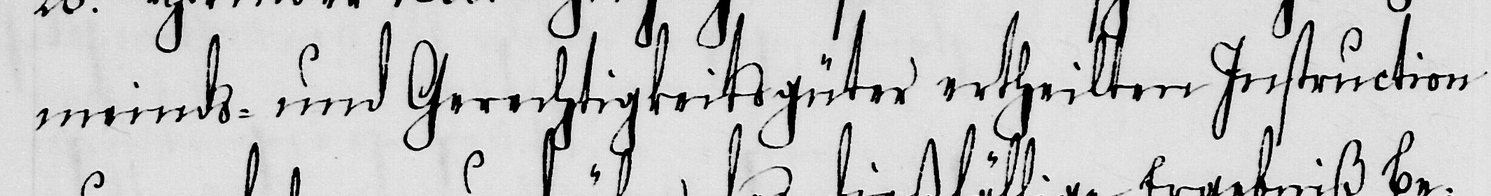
meinds- und Gerechtigkeitsgüter ertheilten Instruction
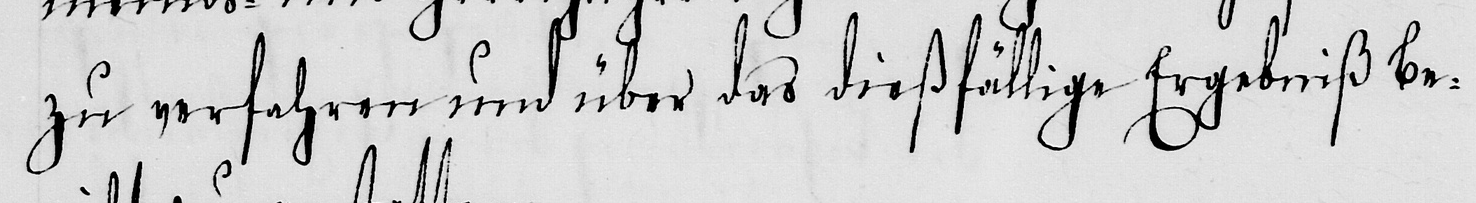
zu verfahren und über das dießfällige Ergebniß Be¬
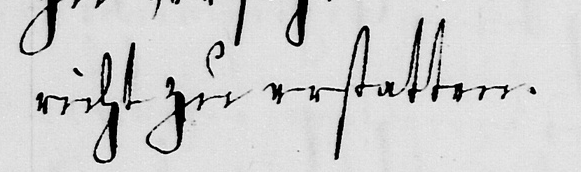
richt zu erstatten.
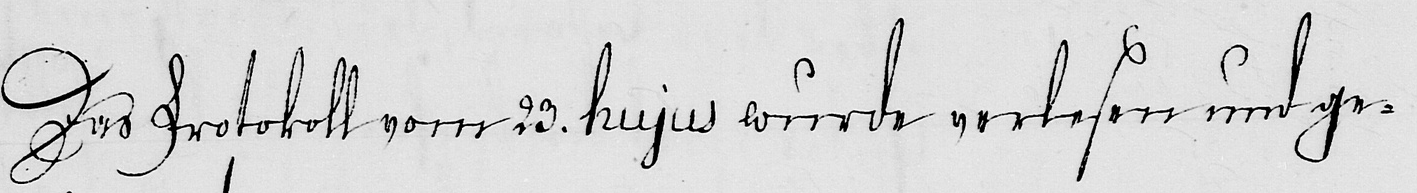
Das Protokoll vom 23. hujus wurde verlesen und ge¬
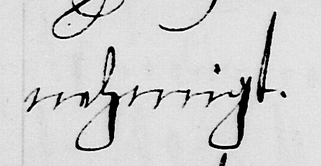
nehmigt.
